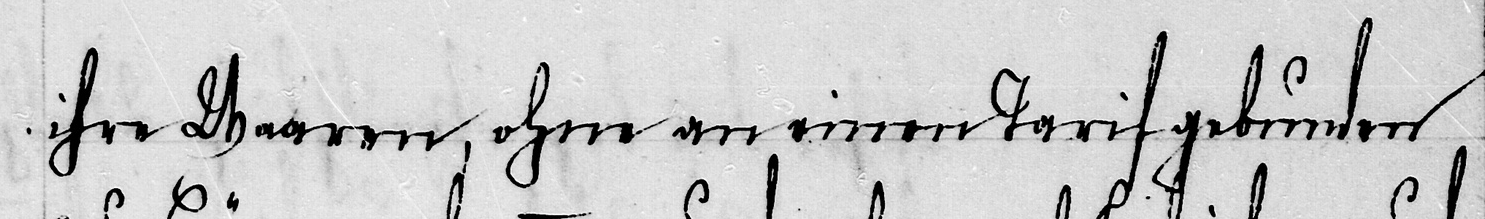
ihre Waaren, ohne an einen Tarif gebunden
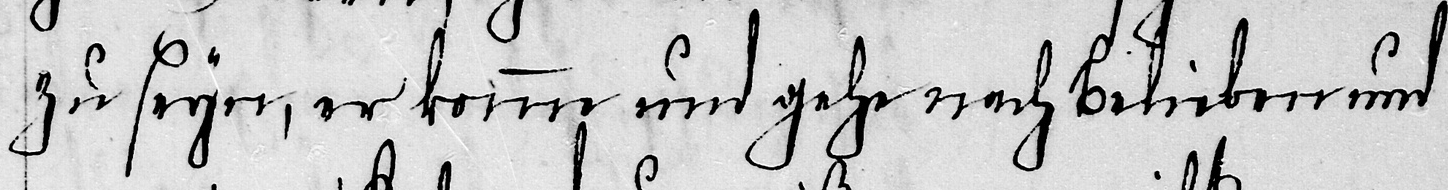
zu seyn, er komme und gehe nach Belieben und
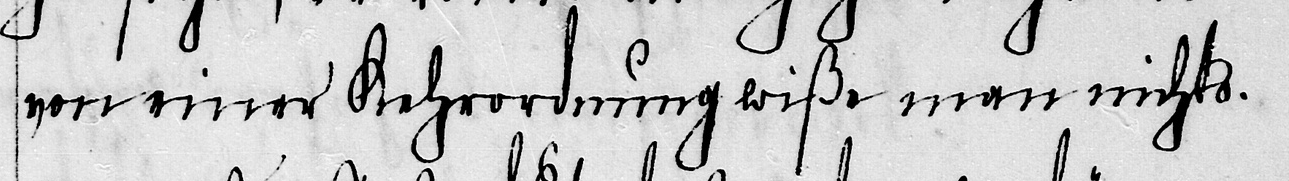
von einer Kehrordnung wiße man nichts.
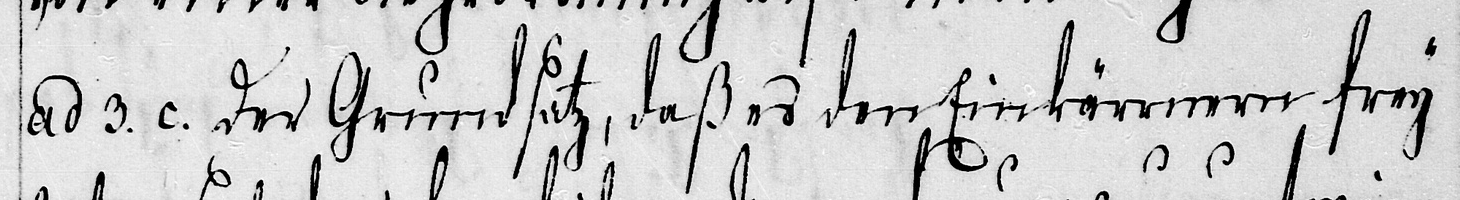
ad 3. c. Der Grundsatz, daß es den Einkärrnern frey
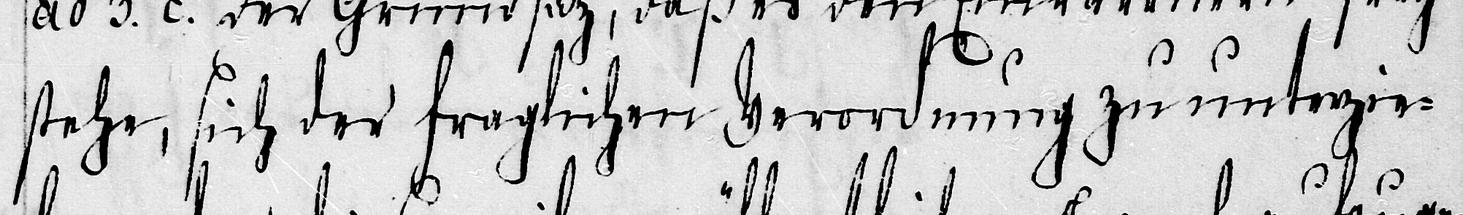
stehe, sich der fraglichen Verordnung zu unterzie¬
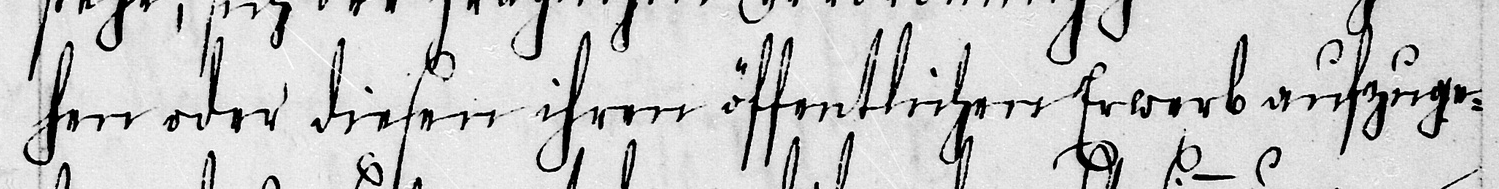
hen oder diesen ihren öffentlichen Erwerb aufzuge¬
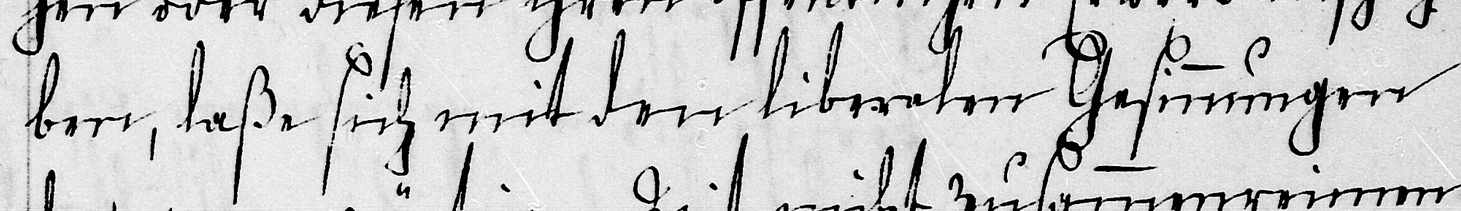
ben, laße sich mit den liberalen Gesinnungen
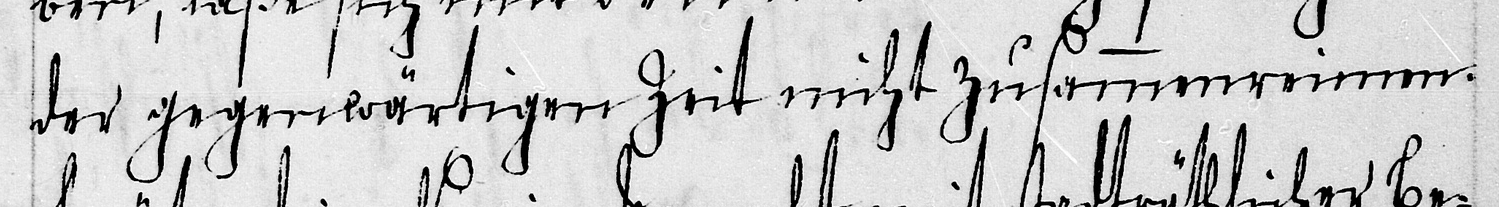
der gegenwärtigen Zeit nicht zusammenreimen.
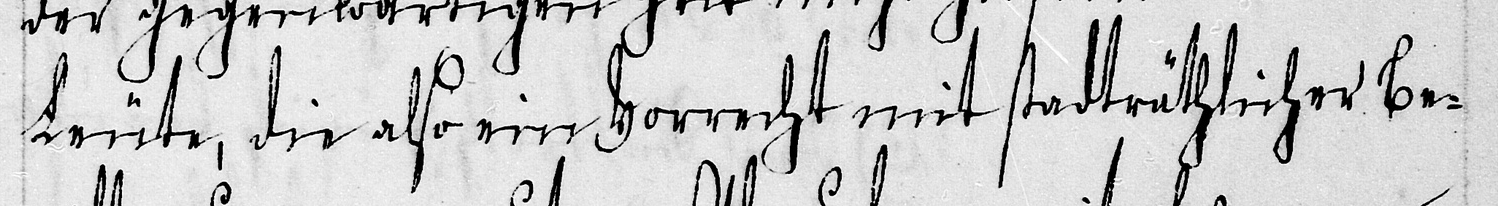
Leute, die also ein Vorrecht mit stadträthlicher Be¬
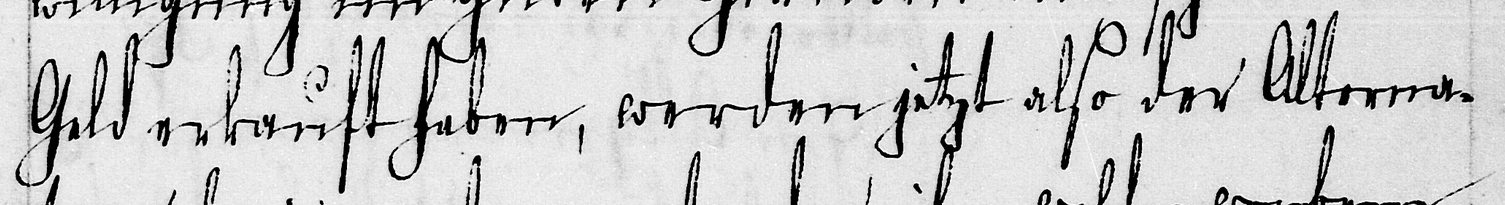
Geld erkauft haben, werden jetzt also der Alterna¬
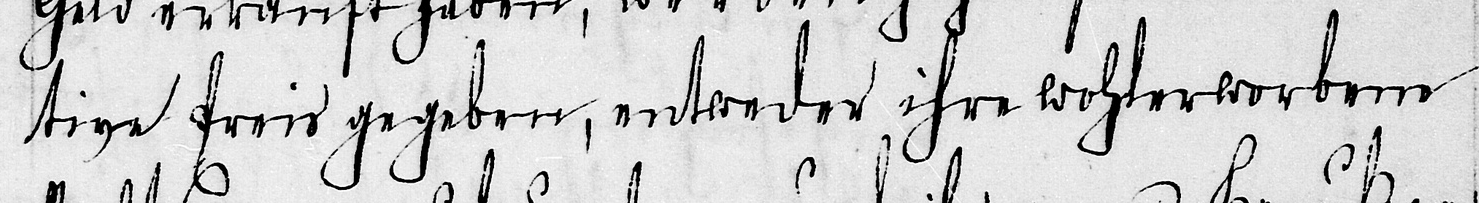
tive Preis gegeben, entweder ihre wohlerworbene
